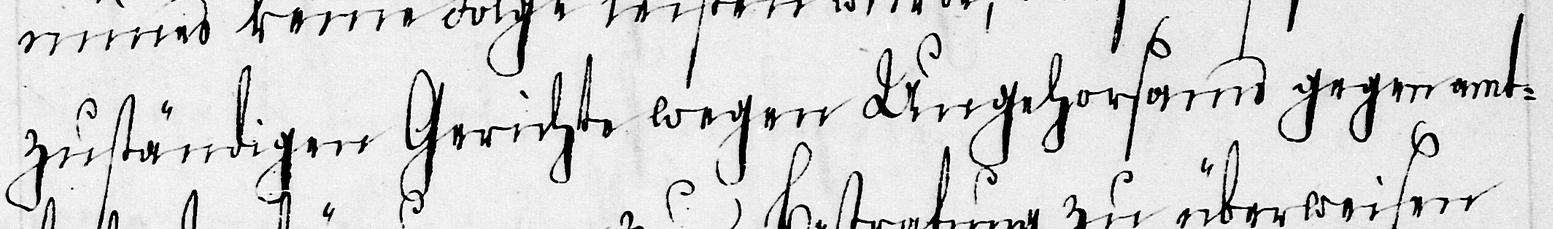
zuständigen Gerichte wegen Ungehorsams gegen amt¬
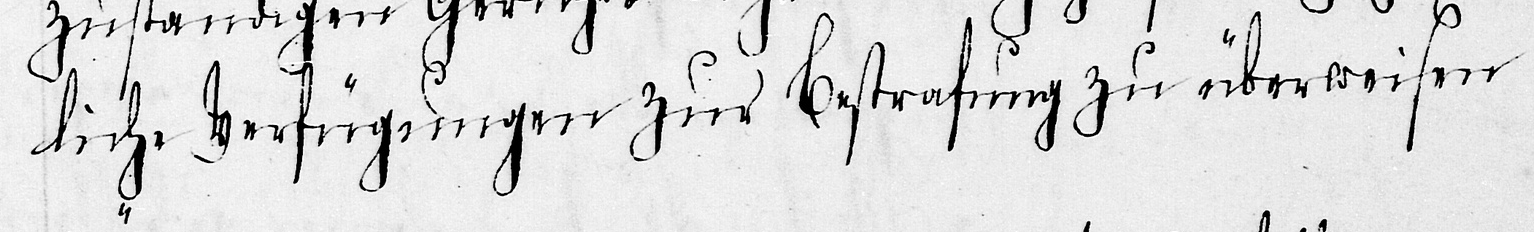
liche Verfügungen zur Bestrafung zu überweisen
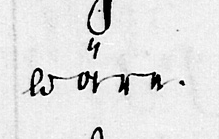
wäre.
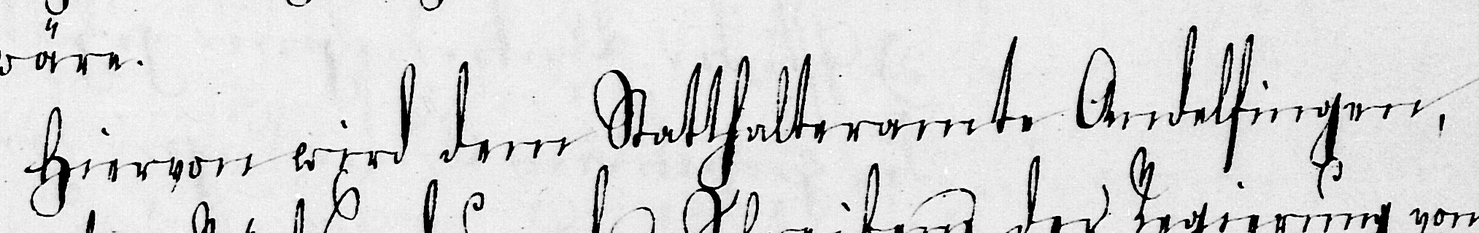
Hiervon wird dem Statthalteramte Andelfingen,
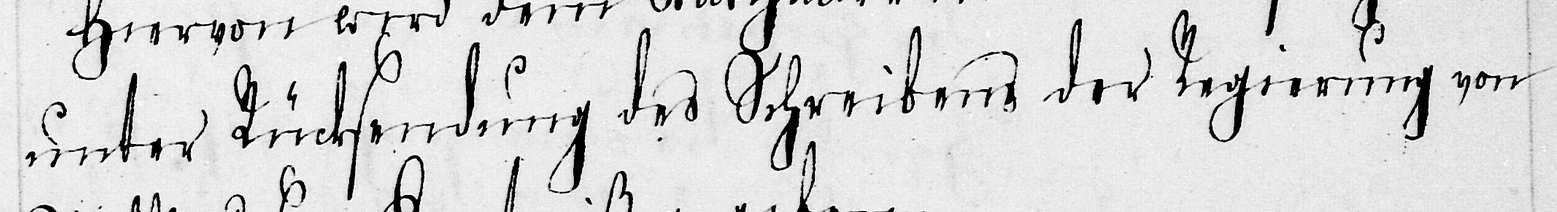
unter Rücksendung des Schreibens der Regierung von
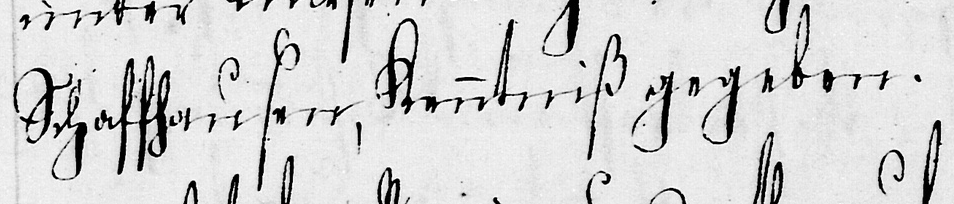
Schaffhausen, Kenntniß gegeben.
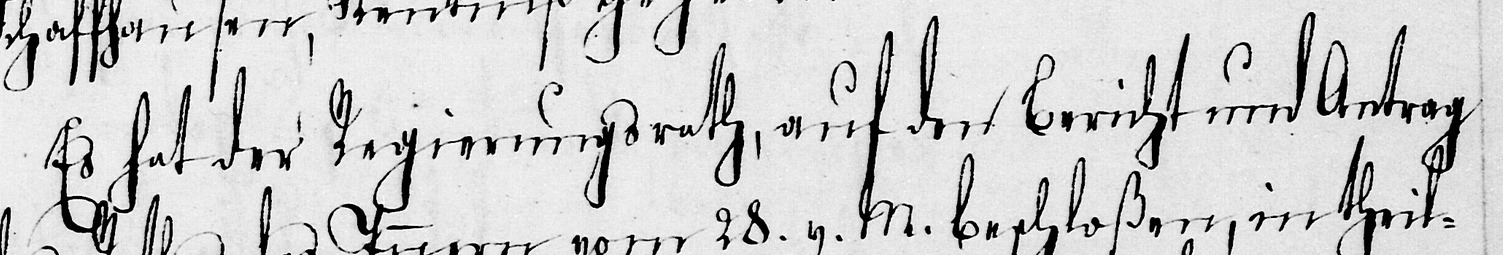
Es hat der Regierungsrath, auf den Bericht und Antrag
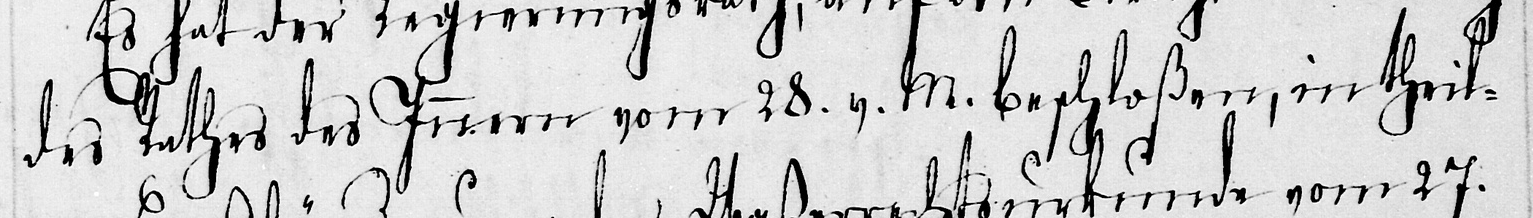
des Rathes des Innern vom 28. v. M. beschloßen, in theil¬
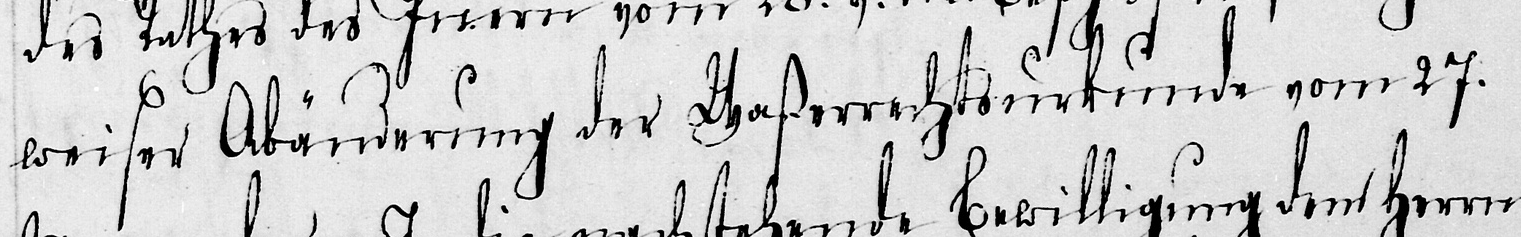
weiser Abänderung der Waßerrechtsurkunde vom 27.
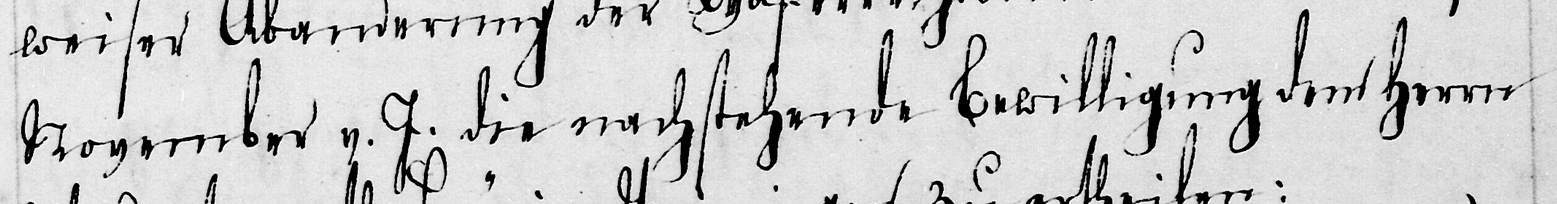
November v. J. die nachstehende Bewilligung dem Herrn
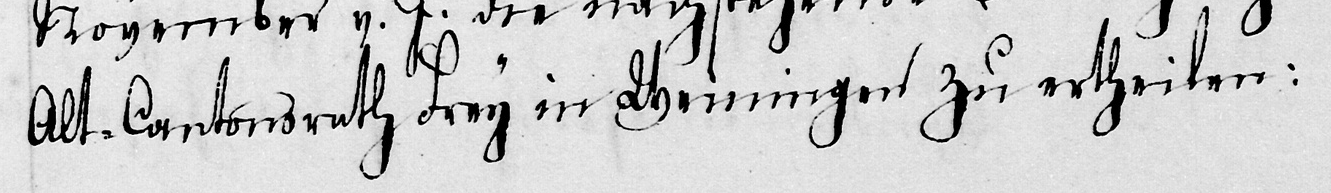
Alt-Cantonsrath Frey in Weiningen zu ertheilen:
